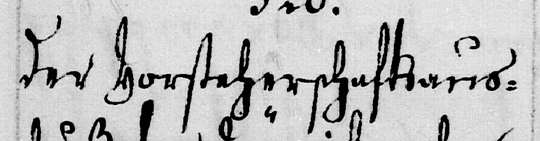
der Vorsteherschaftsauss¬
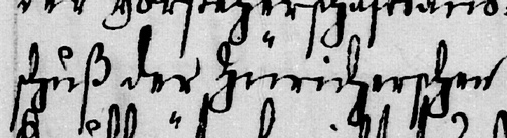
chuß der Züricherschen
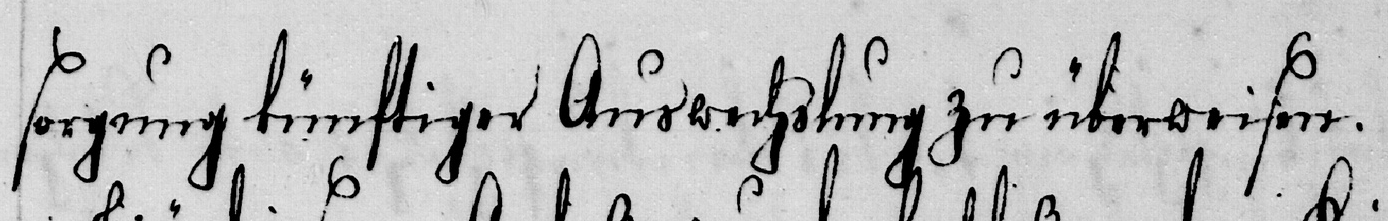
sorgung künftiger Auswechslung zu überweisen.
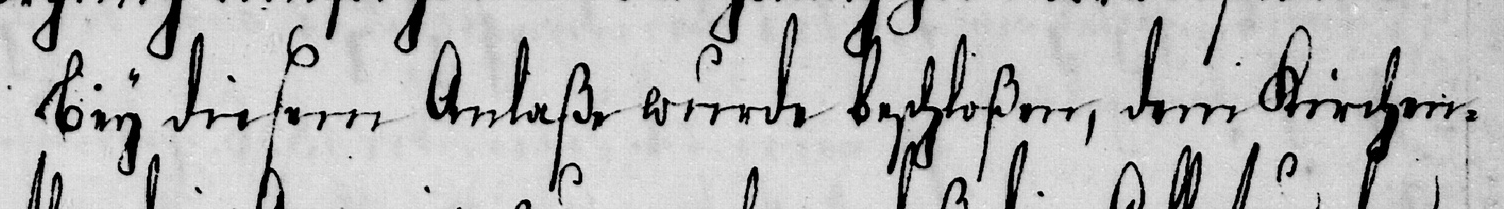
Bey diesem Anlaße wurde beschloßen, dem Kirchen¬
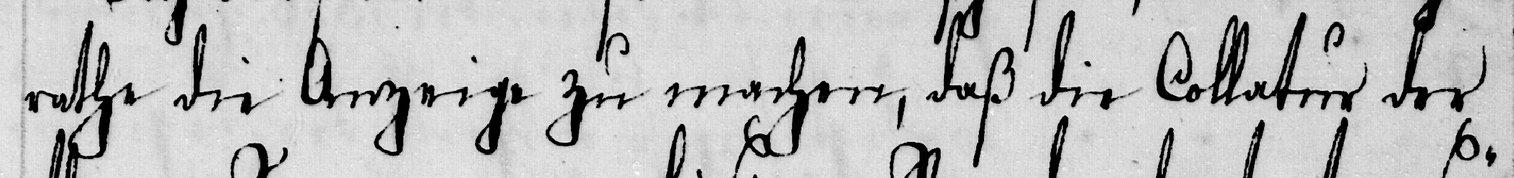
rathe die Anzeige zu machen, daß die Collatur der
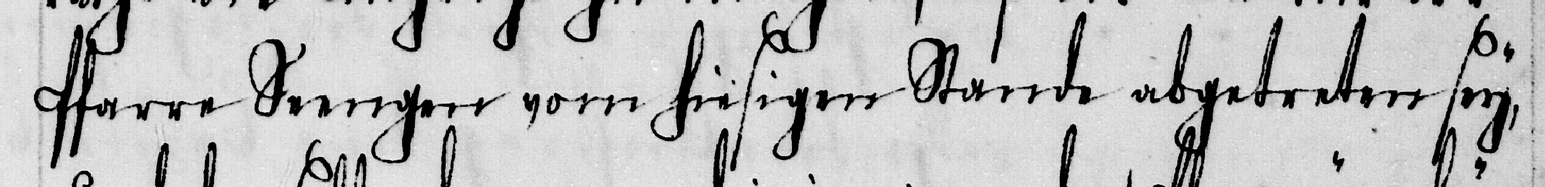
Pfarre Seengen vom hiesigen Stande abgetreten sey,
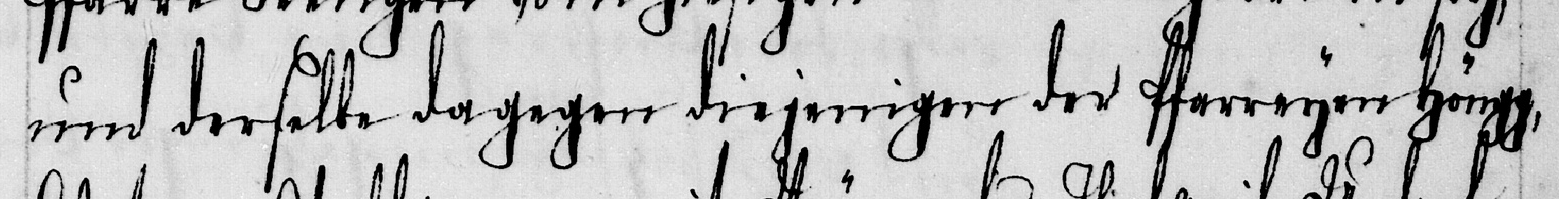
und derselbe dagegen diejenigen der Pfarreyen Höng¬
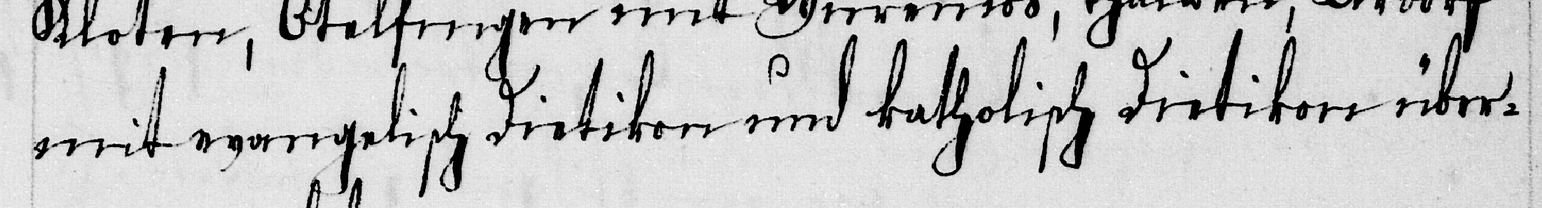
mit evangelisch Dietikon und katholisch Dietikon über¬
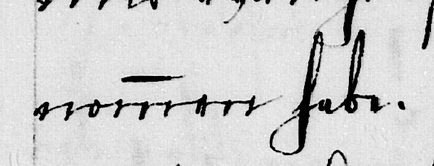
nommen habe.
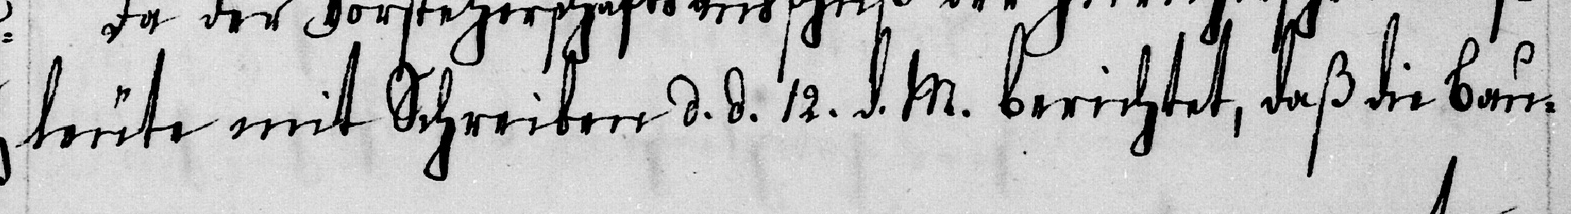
leute mit Schreiben d. d. 12. d. M. berichtet, daß die Bau-
